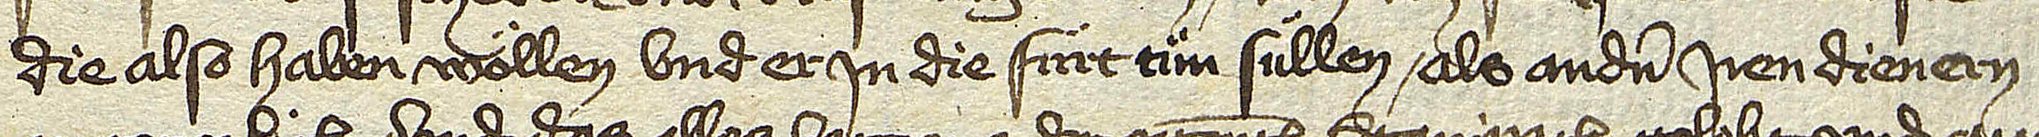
die alſo haben wöllen vnd er In die fürt tün ſüllen / als andn* Iren dienern
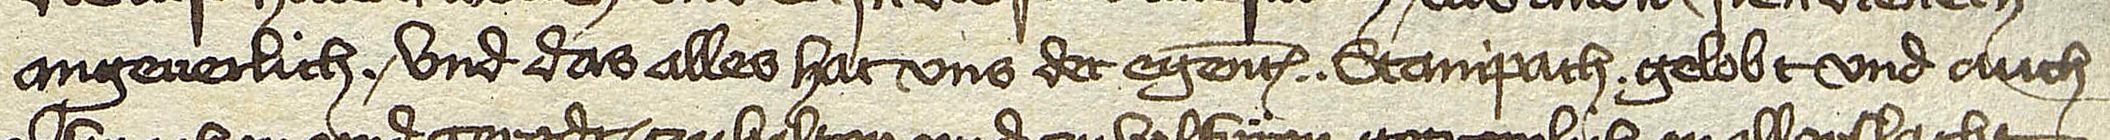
angeuerlich ./ vnd das alles hat vns der egent* .. Stainpach gelobt vnd auch
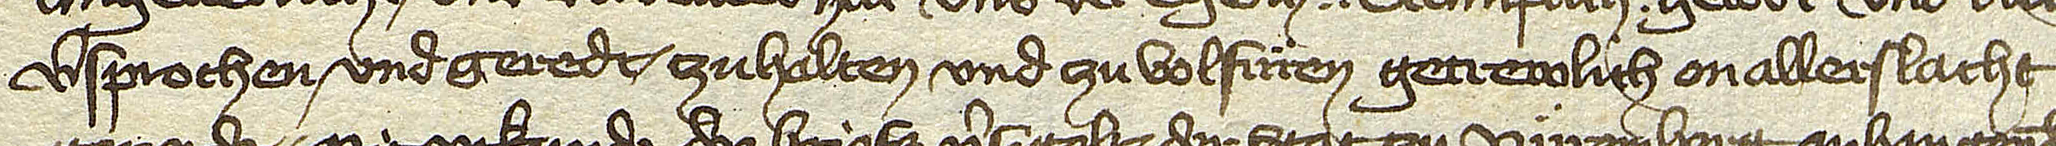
v*ſprochen / vnd geredt / cʒuhalten vnd cʒu volfüren getrewlich on allerſlacht
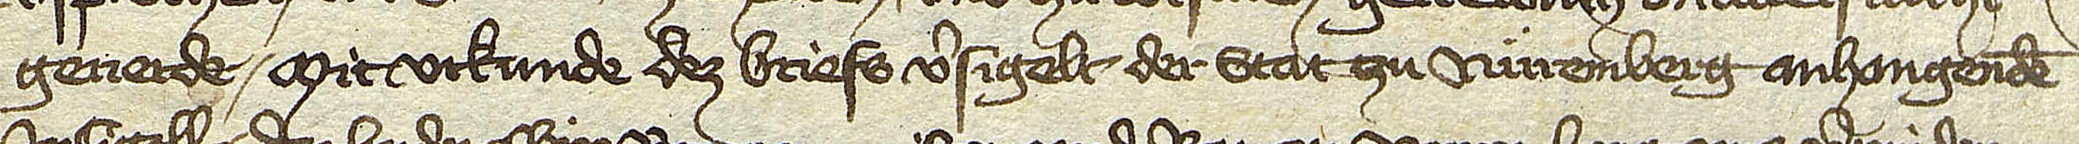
geuerde / Mit vrkunde deʒ briefs v*ſigelt der ſtat cʒu Nüremberg anhongende*
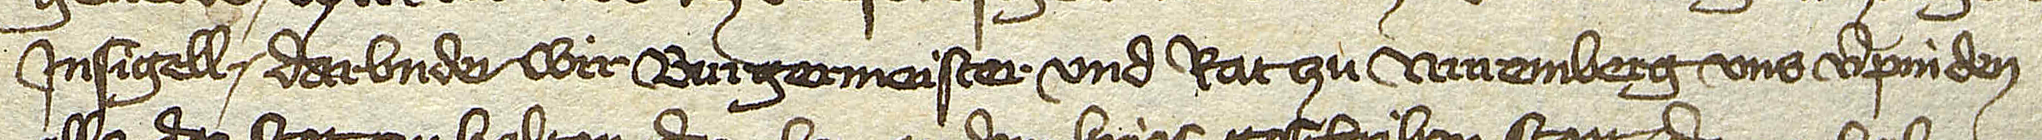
Inſigell / darvnder wir Burgermeiſter vnd Rat cʒu Nuremberg vns v*pinden
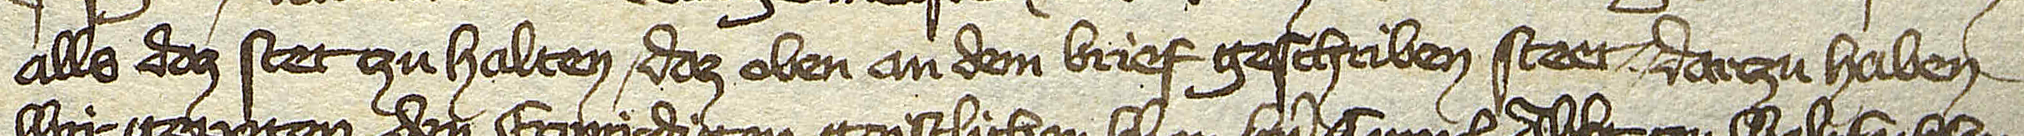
alls daʒ ſtet cʒu halten / daʒ oben an dem brief geſchriben ſteet / darcʒu haben
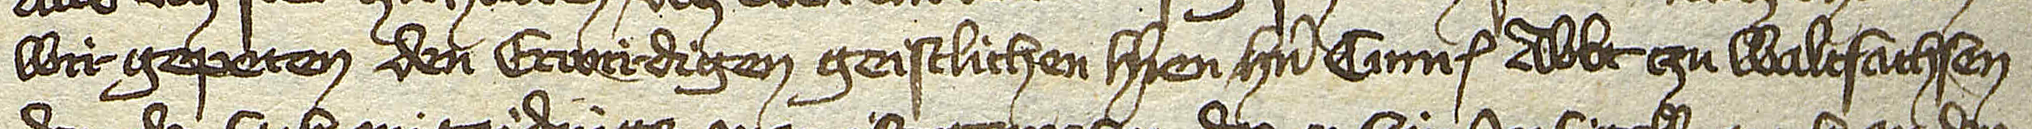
wir gepeten den Erwirdigen geiſtlichen h*ren hn* Cum* Abbt cʒu waltſachſen
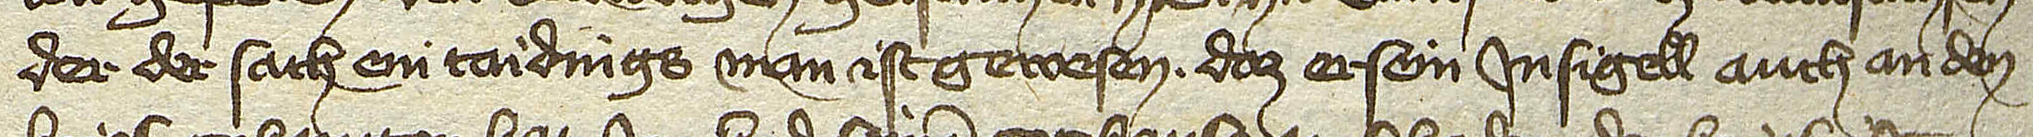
der der ſache ein taidings man iſt geweſen. daʒ er ſein Inſigell auch an den
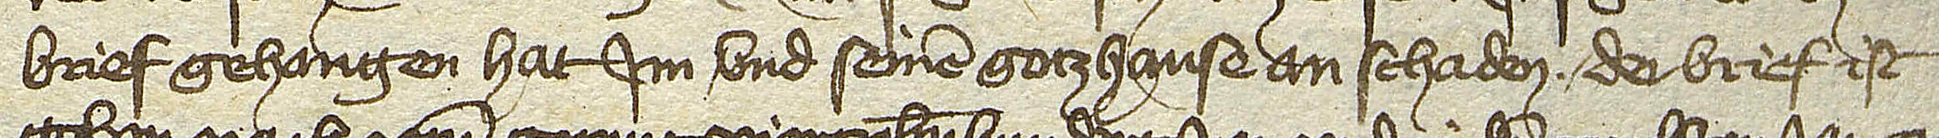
brief gehangen hat Im vnd ſeine gocʒhauſe an ſchaden ./ der brief iſt
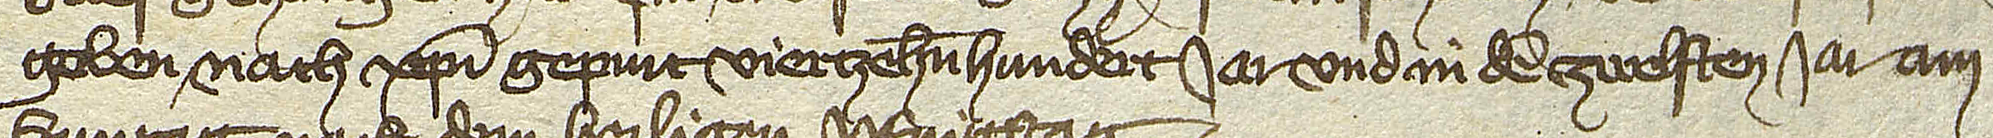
geben nach xpi* gepurt viercʒehn* hundert Iar vnd in de* cʒwelften Iar am
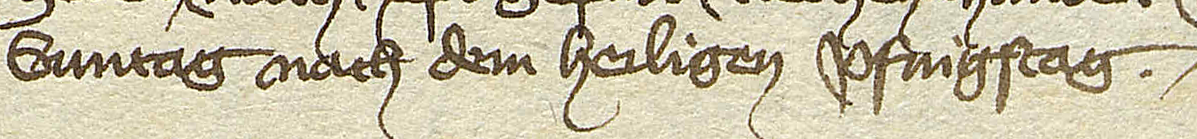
Suntag nach dem heiligen pfingſtag .
